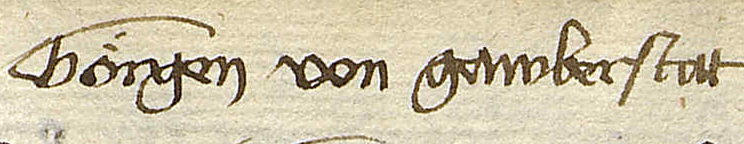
Görgen von gawberſtat
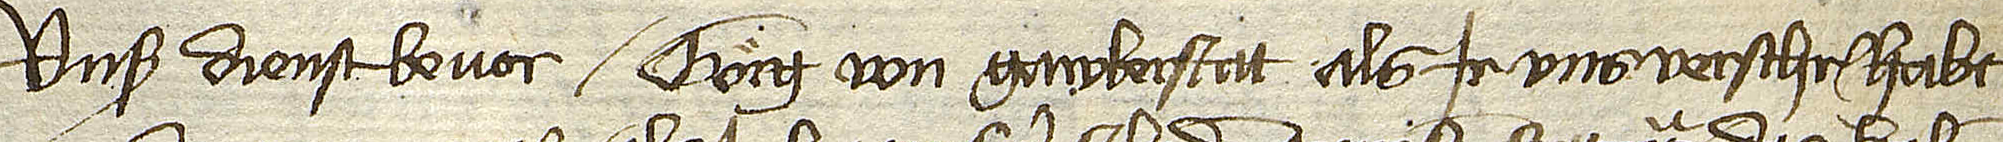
Vnſ* dienſt beuor / Görg von gawberſtat als Ir vns verſchr* habt
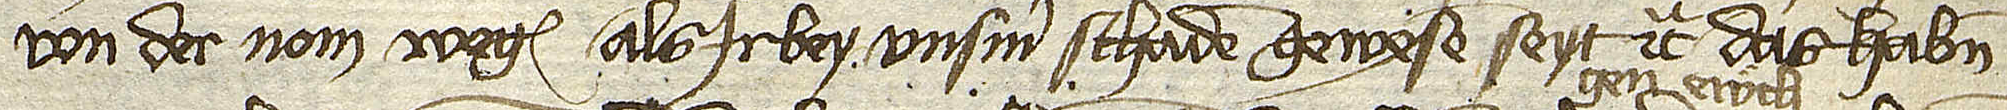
von der nom weg* / als Ir bey vnſm* ſchade* geweſe* ſeyt ec* / Das habn*
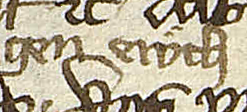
gen eẅch
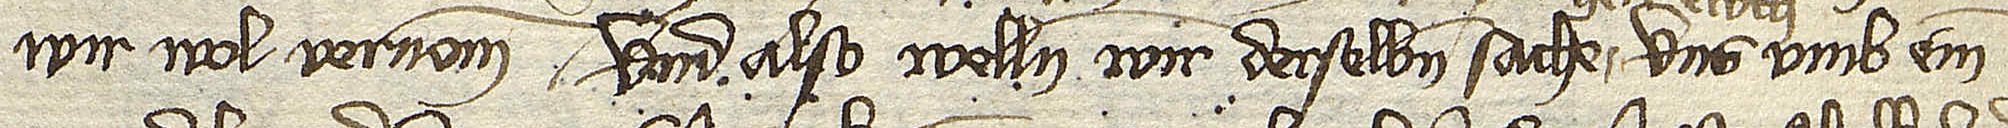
wir wol vernom* / Vnd alſo welln* wir derſelbn* ſache / Vns vmb ein*
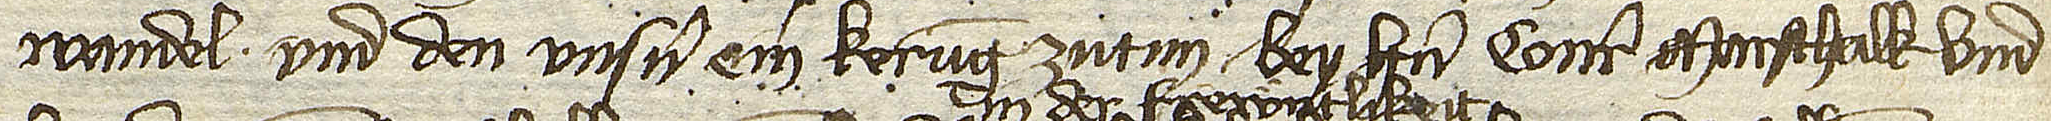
wandel / vnd den vnſn* ein keru*g ʒutun / bey hn* Conr* Marſchalk Vnd
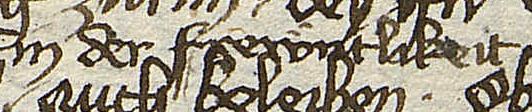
in der freẅntlikeit
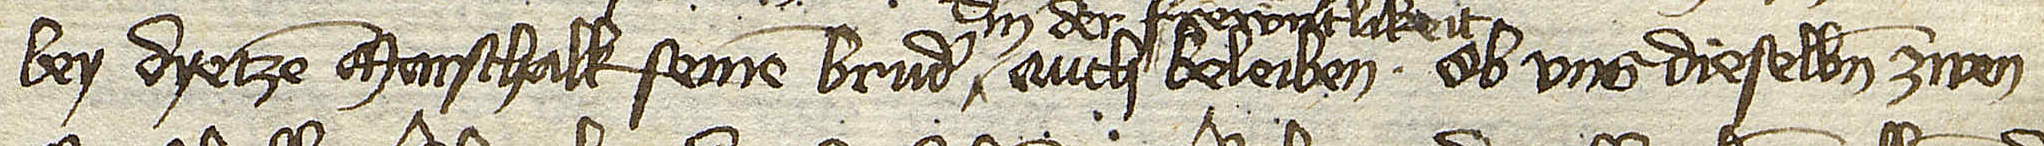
bey dyecʒe* Marſchalk ſein* brud* / auch beleiben . Ob vns dieſelbn* ʒwen
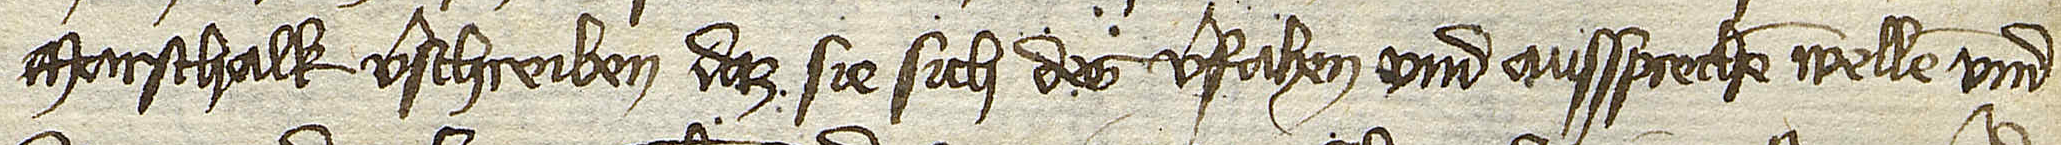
Marſchalk v*ſchreiben daʒ ſie ſich des v*fahen vnd auſſpreche* welle* vnd
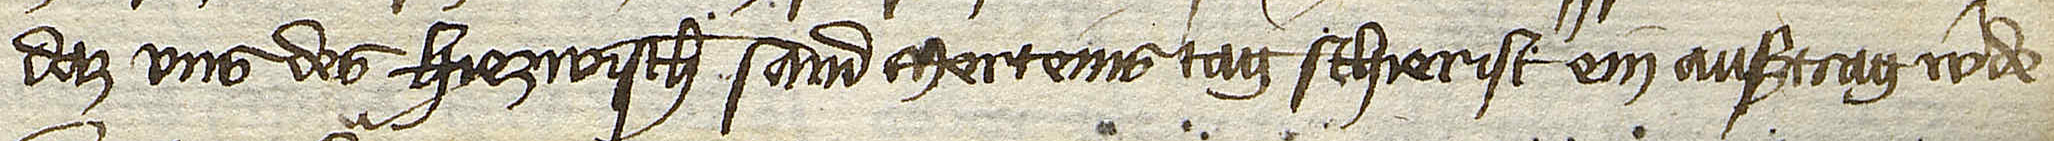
daʒ vns des hieʒwiſch* ſand Merteins tag ſchieriſt ein auſʒtrag w*de
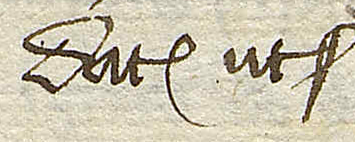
Dat* ut ſ*
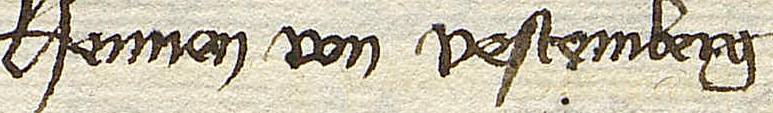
Hennen von Veſtemberg
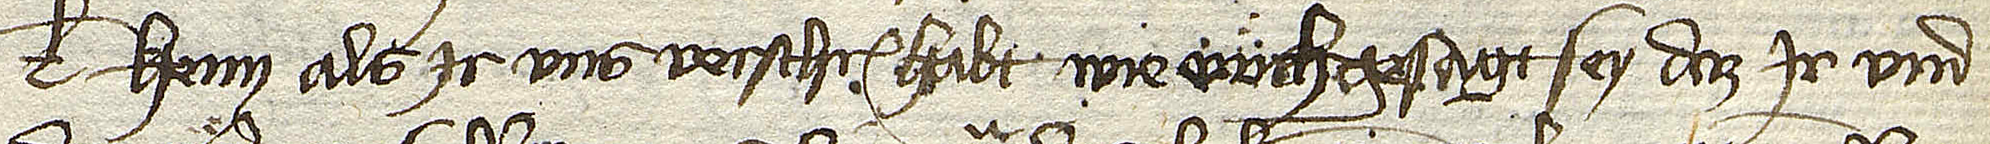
L* henn als Ir vns verſchr* habt wie ewch geſagt ſey daʒ Ir vnd
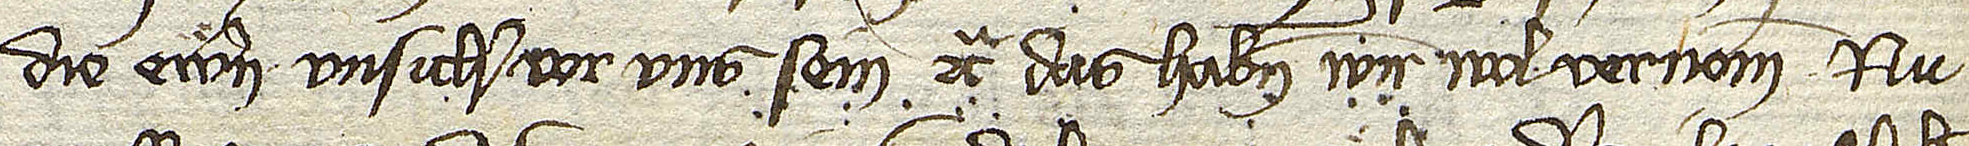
die eẅ*n / vnſich* vor vns ſein ec* das habn* wir wol vernom* . Nu
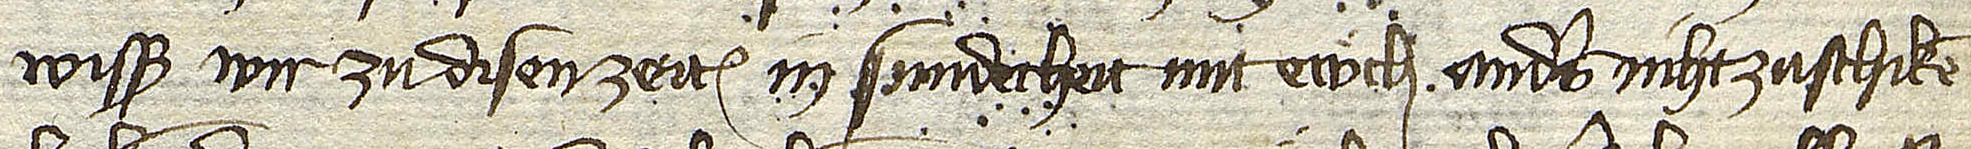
wiſſ* wir ʒu diſen ʒeit* in ſunderheit mit eẅch and*s niht ʒuſchike*
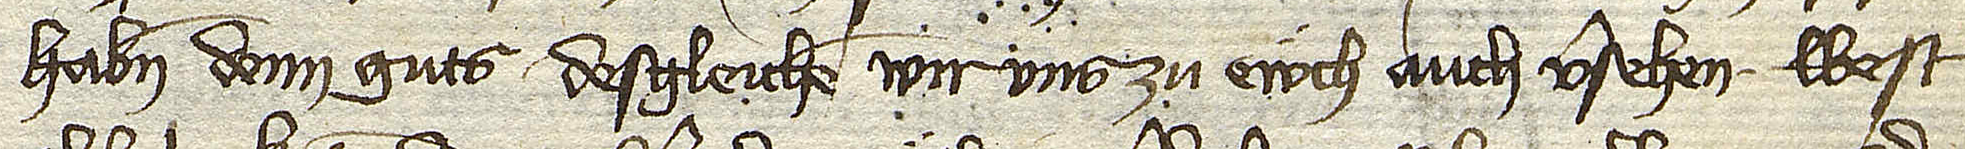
habn* denn guts / Deſgleiche* wir vns ʒu eẅch auch v*ſehen / Weſt
